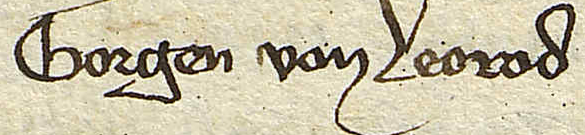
Gorgen von Leorod
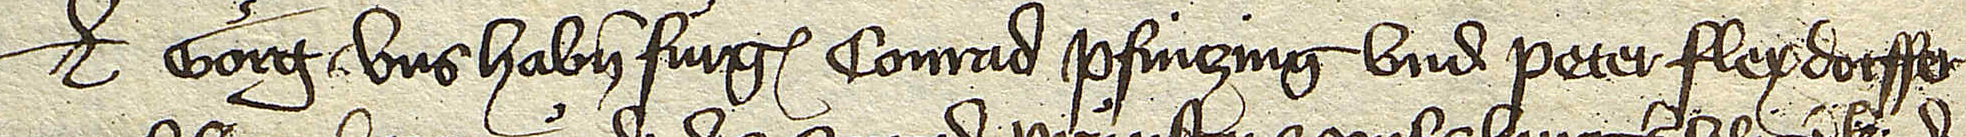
L* Görg / vns habn* fürg* Conrad Pfincʒing vnd Peter flexdorffer
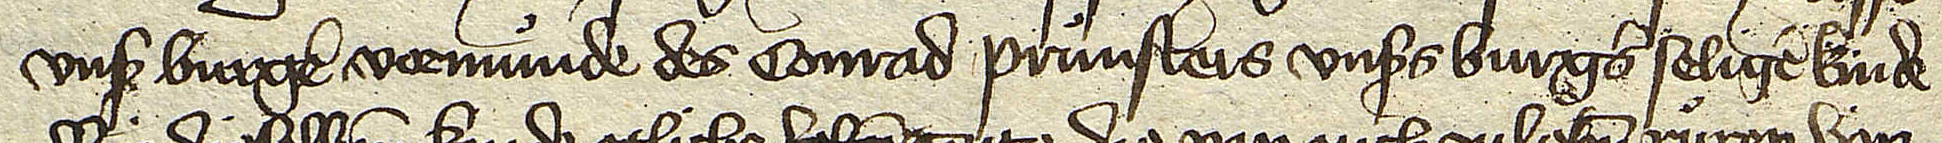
vnſ* burge* vormünde des Conrad Prünſters vnſ*s burgs* ſelige* kinde
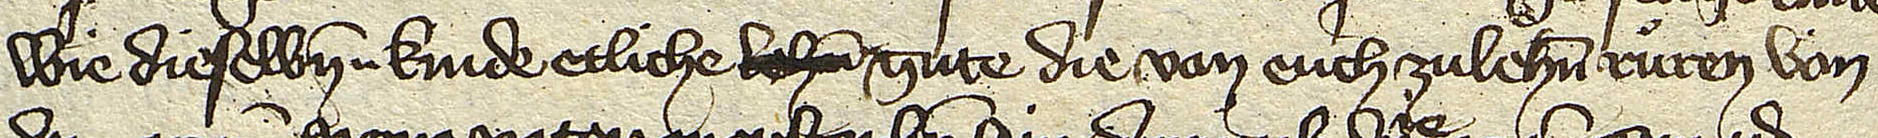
wie dieſelbn* ~ kinde etliche lehn* gute die von euch cʒulehn* rüren von
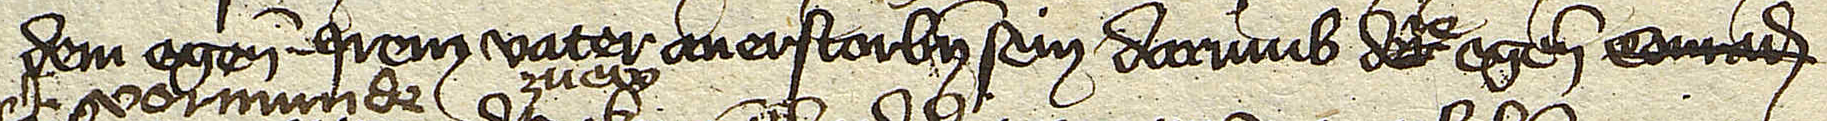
dem egen* ~ Irem vater anerſtorbn* ſein darümb der egen* Conrad*
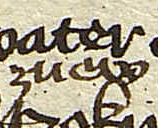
ʒu ew
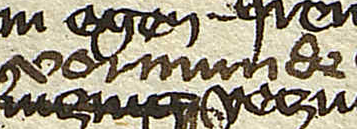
vormunde
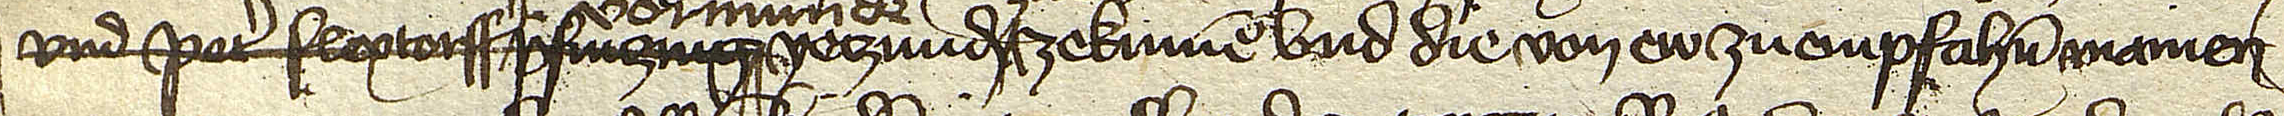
vnd Pet* flextorff* / Pfincʒing yecʒund cʒekume* vnd die von ew cʒu empfahn* mainen
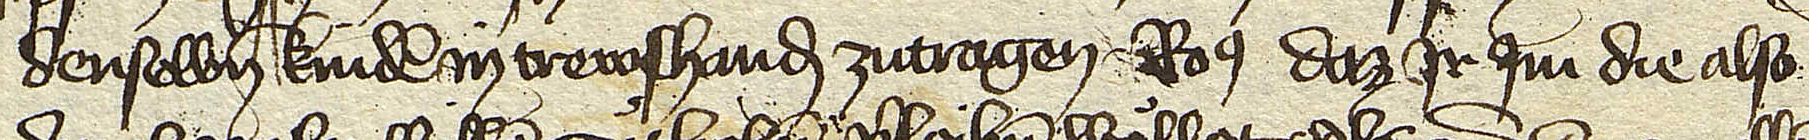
denſelbn* kinde* in trewſhand* ʒutragen / Ro* daʒ Ir Im die alſo
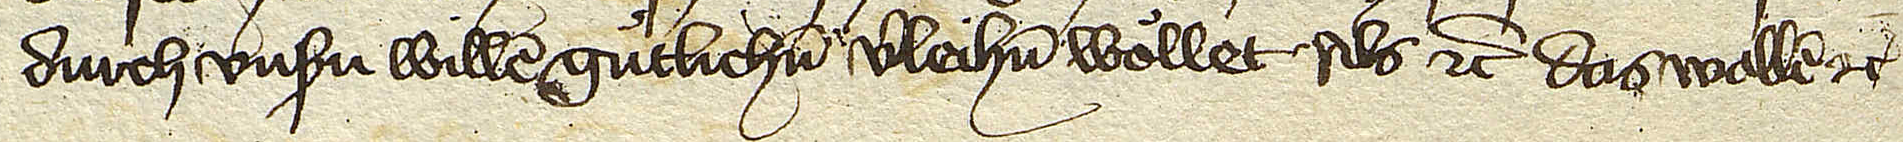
durch vnſ*n wille* gütlichn* v*leihn* wöllet / Als ec* das wolle* ec*
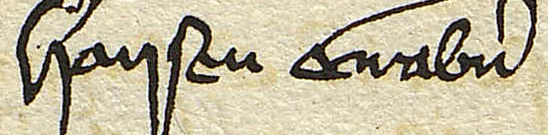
hanſen Grabn*
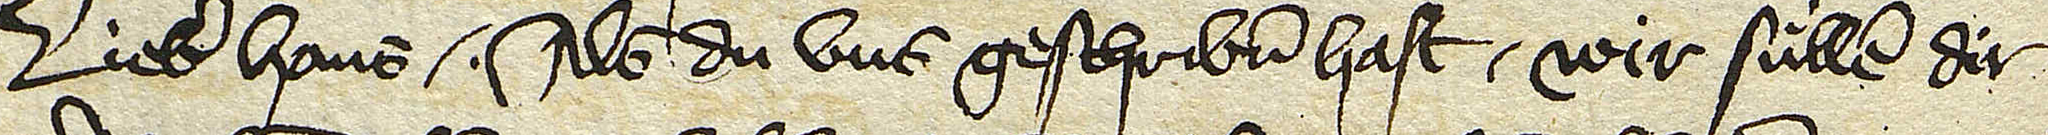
Lieb* hans / . Als du vns geſchribn* haſt / wir ſülle* dir
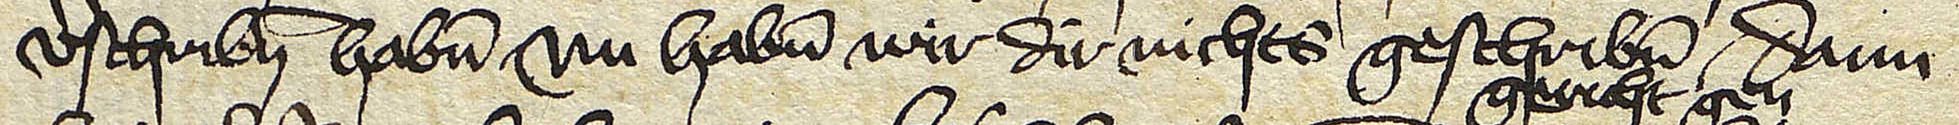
v*ſchribn* habn* / Nu habn* wir dir nichts geſchribn* / Dann
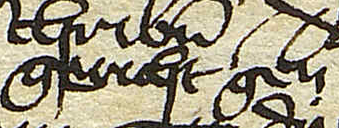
gericht gen
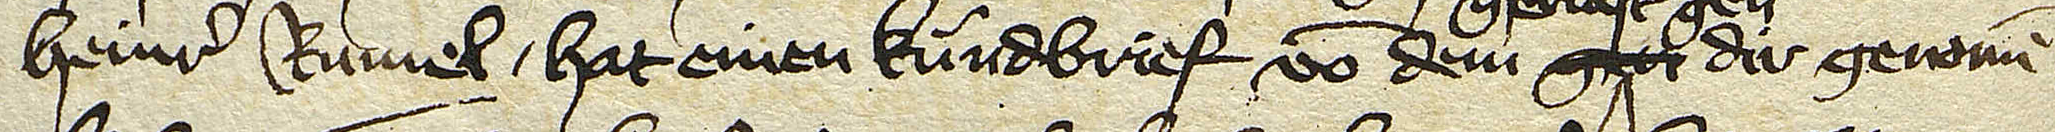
heinr* Rumel / hat einen kündbrief vo* dem gen dir genome*
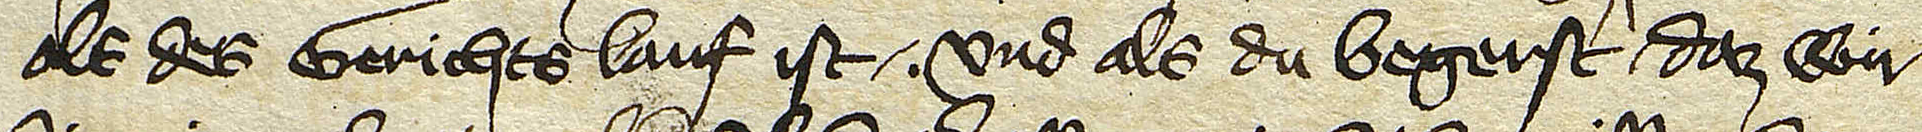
als des Gerichts lauf iſt / . vnd als du begerſt / daʒ wir
